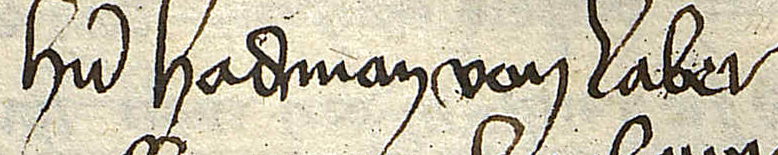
hn* hadman von Laber
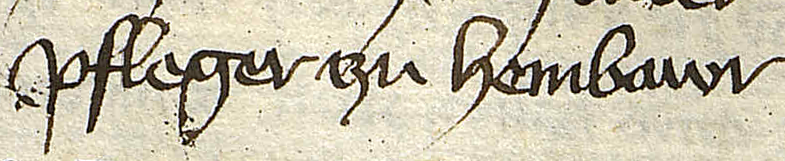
Pfleger cʒu heinbawr
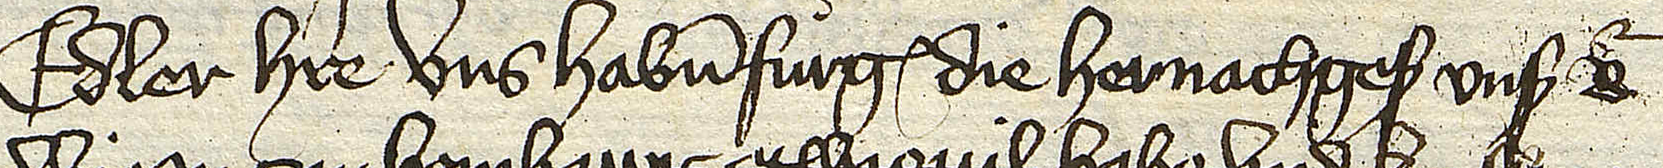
Edler hr*e . Vns habn* fürg* die hernachgeſ* vnſ* B*
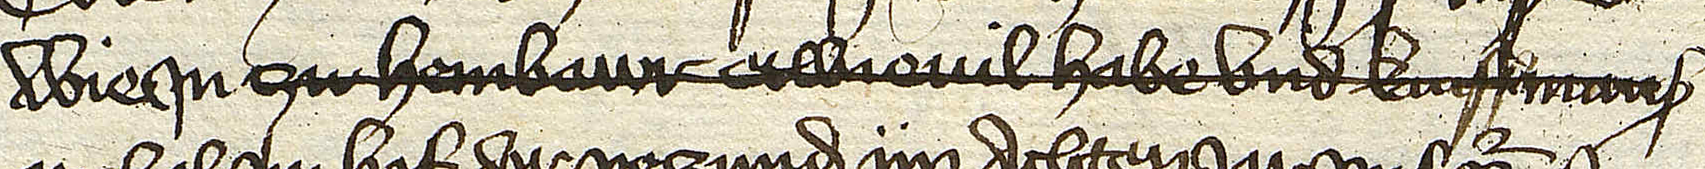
wie In cʒu heinbawr etwieuil habe vnd kauffmanſ*
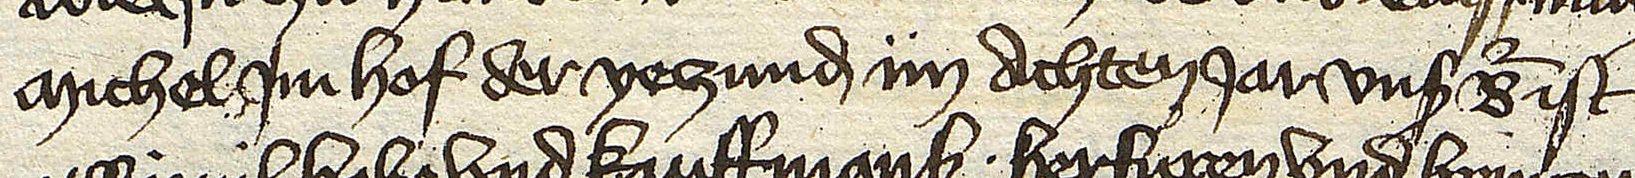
Michel Im hof der yecʒund* im Achten Iar vnſ* B* iſt
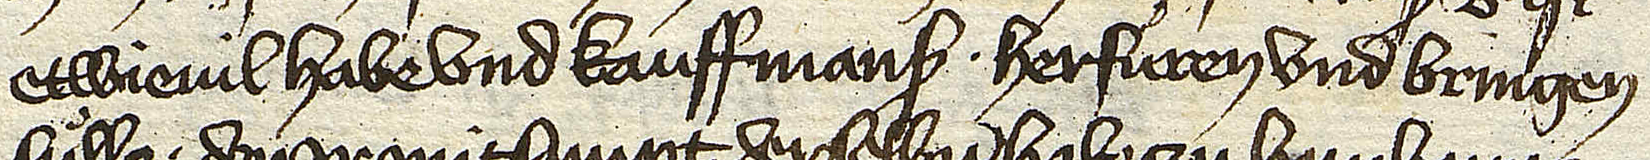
etwieuil habe vnd kauffmanſ* . herfüren vnd bringen
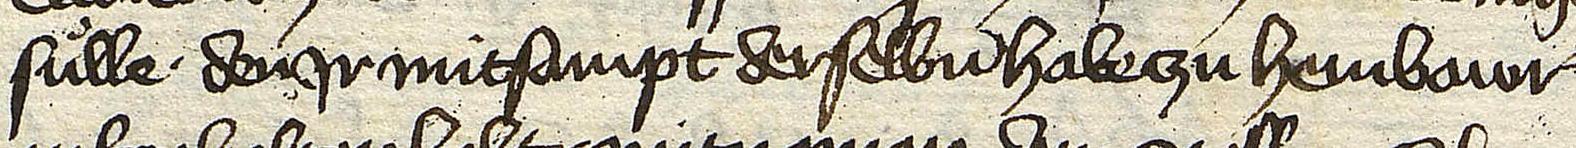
ſülle / den Ir mitſampt derſelbn* habe cʒu heinbawr
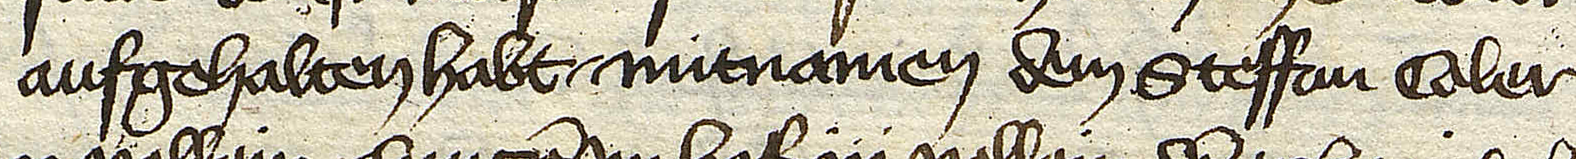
aufgehalten habt / mitnamen dem Steffan Coler
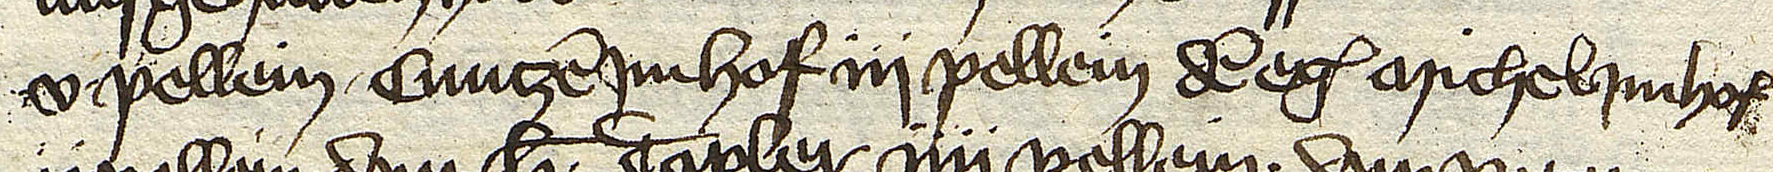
v pellein / Cuncʒe* Imhof iii pellein d* eg* Michel Imhof
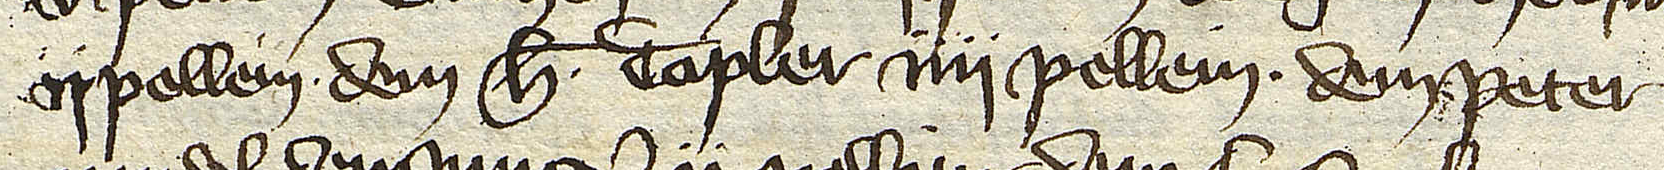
ii pellein . dem h* . Topler iiii pellein . dem Peter
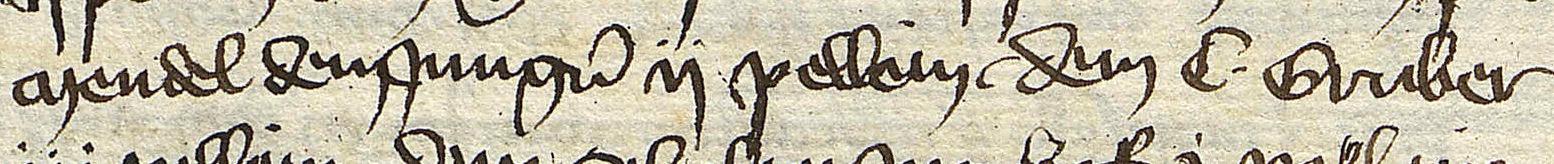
Mendel dem Iungn* ii pellein / dem C . Gruber
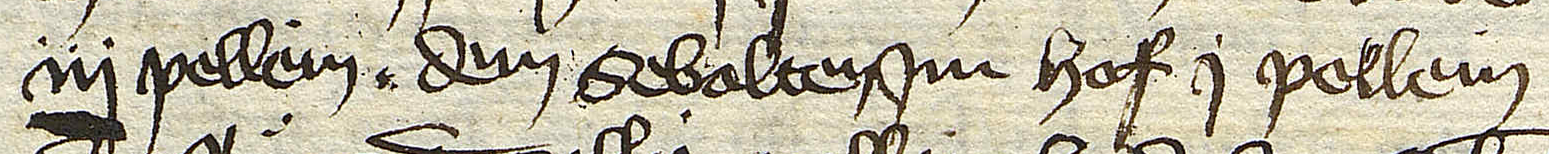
iii pellein . dem Sebolten Imhof i pellein
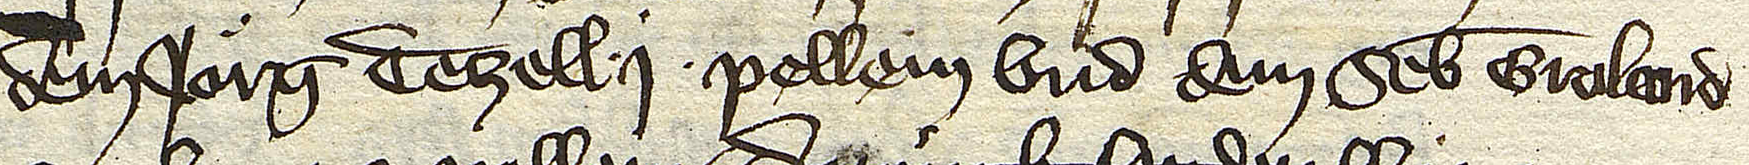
dem Iörg Tecʒell . i . pellein vnd dem Seb* Groland
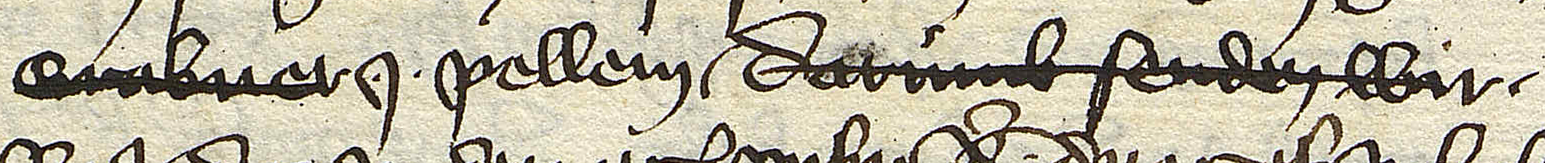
Grabner . i . pellein / Darümb ſenden wir /
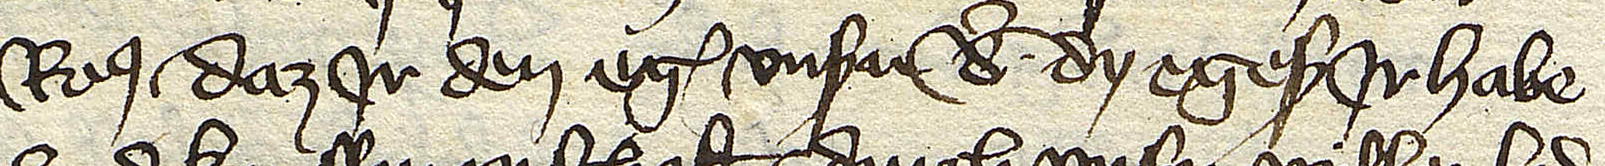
Ro* / daʒ Ir den eg* vnſ*n B* . dy egeſ* Ir habe
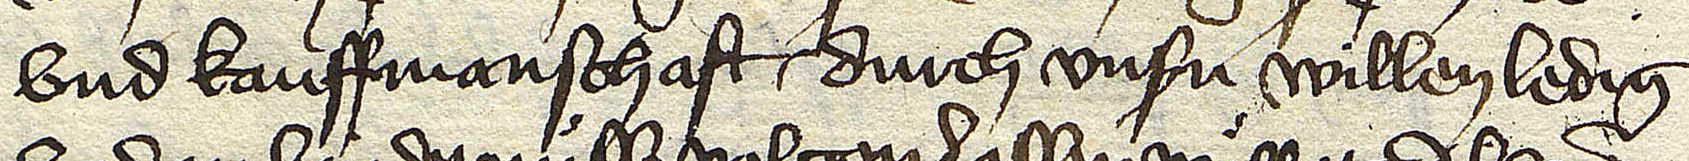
vnd kauffmanſchaft / durch vnſ*n willen ledig
